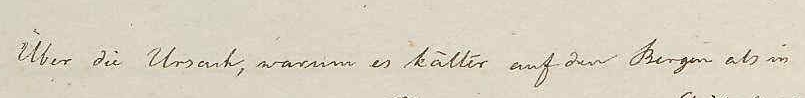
Über die Ursach, warum es kälter auf den Bergen als in
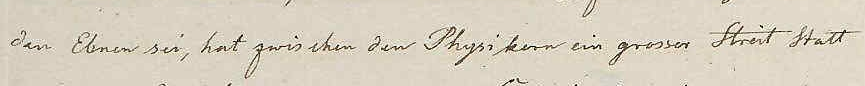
den Ebnen sei, hat zwischen den Physikern ein grosser Streit Statt
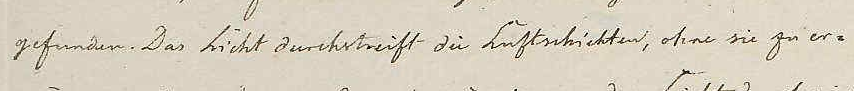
gefunden. Das Licht durchstreift die Luftschichten, ohne sie zu er-
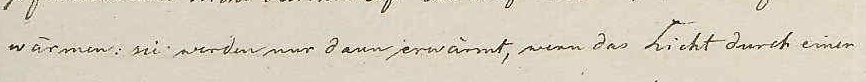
wärmen: sie werden nur dann erwärmt, wenn das Licht durch einen
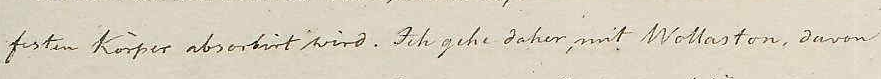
festen Körper absorbirt wird. Ich gehe daher, mit Wollaston, davon
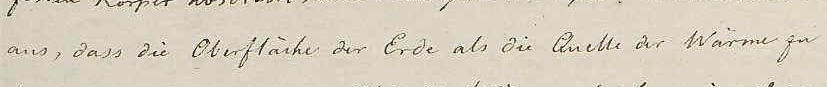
aus, dass die Oberfläche der Erde als die Quelle der Wärme zu
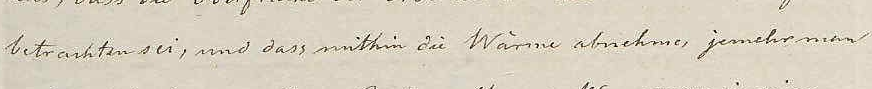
betrachten sei, und dass mithin die Wärme abnehme, jemehr man
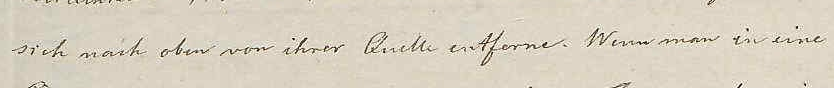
sich nach oben von ihrer Quelle entferne. Wenn man in eine
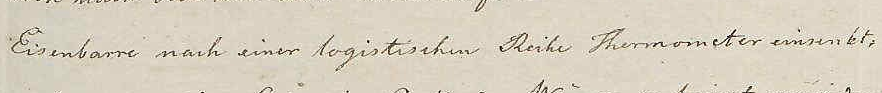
Eisenbarre nach einer logistischen Reihe Thermometer einsenkt,
